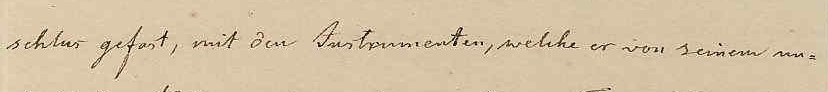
schlus gefast, mit den Instrumenten, welche er von seinem un-
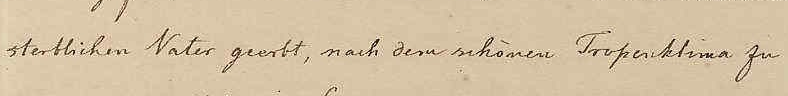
sterblichen Vater geerbt, nach dem schönen Tropenklima zu
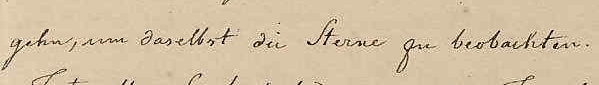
gehn, um daselbst die Sterne zu beobachten.
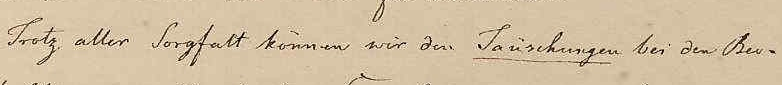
Trotz aller Sorgfalt können wir den Täuschungen bei den Beo-
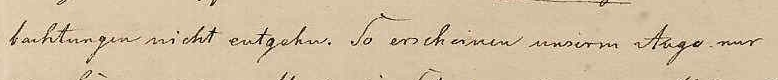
bachtungen nicht entgehn. So erscheinen unserm Auge nur
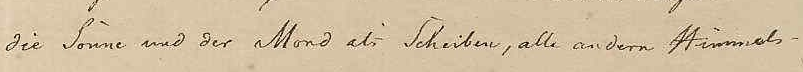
die Sonne und der Mond als Scheiben, alle andern Himmels-
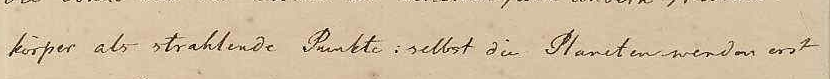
körper als strahlende Punkte: selbst die Planeten werden erst
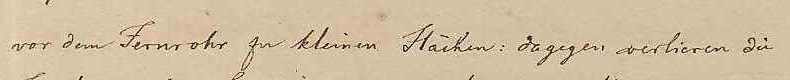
vor dem Fernrohr zu kleinen Flächen: dagegen verlieren die
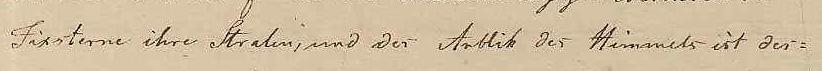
Fixsterne ihre Stralen, und der Anblick der Himmels ist des-
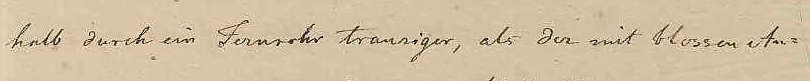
halb durch ein Fernrohr trauriger, als der mit blossen Au-
